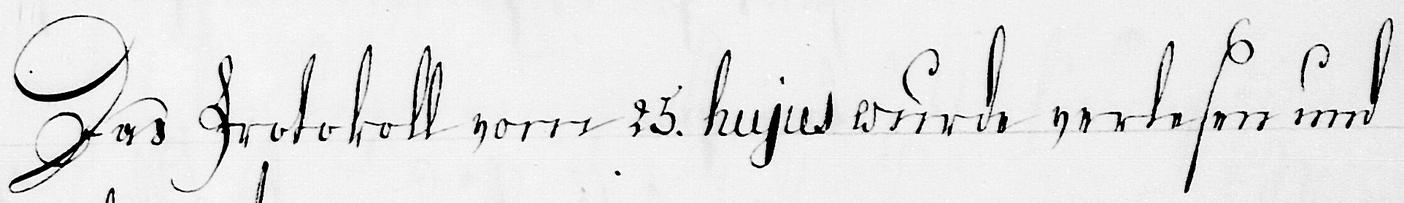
Das Protokoll vom 25. hujus wurde verlesen und
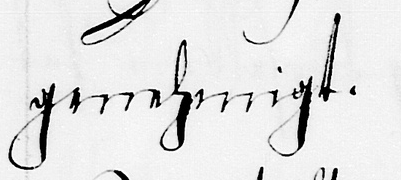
genehmigt.
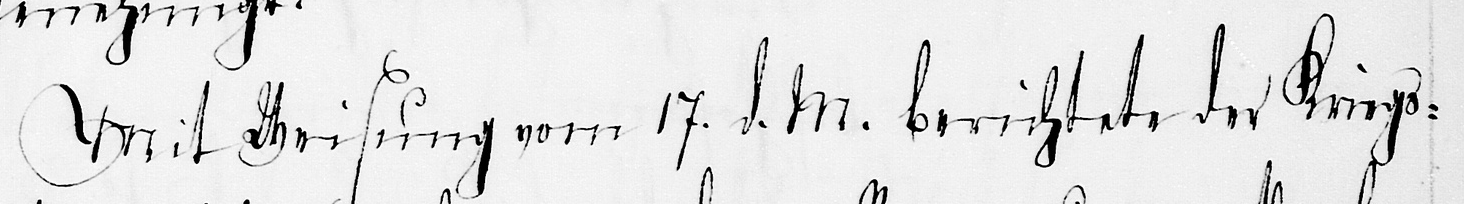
Mit Weisung vom 17. d. M. berichtete der Kriegs¬
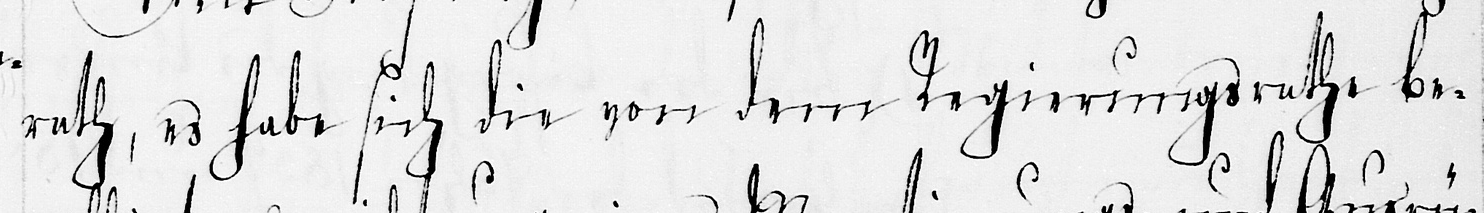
rath, es habe sich die von dem Regierungsrathe be¬
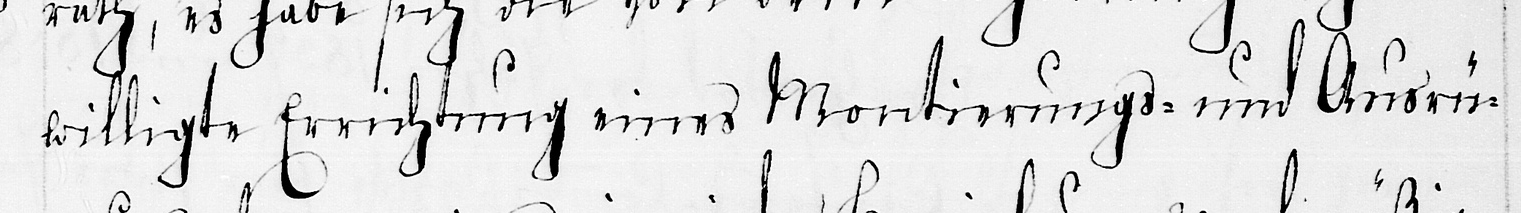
willigte Errichtung eines Montierungs- und Ausrü¬
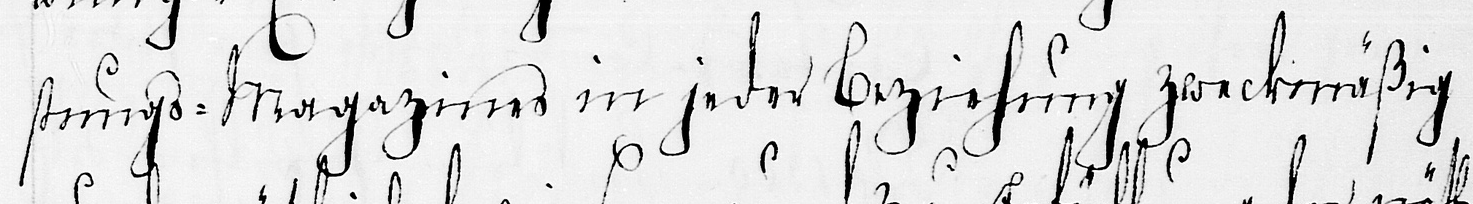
stungs-Magazines in jeder Beziehung zweckmäßig
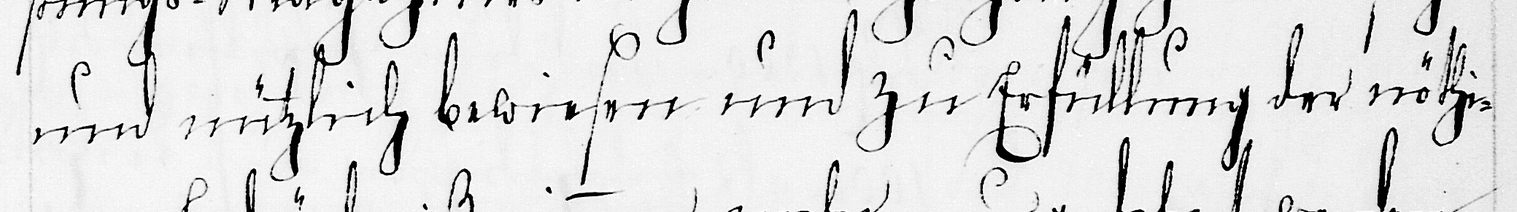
und nützlich bewiesen und zu Erfüllung der nöthi¬
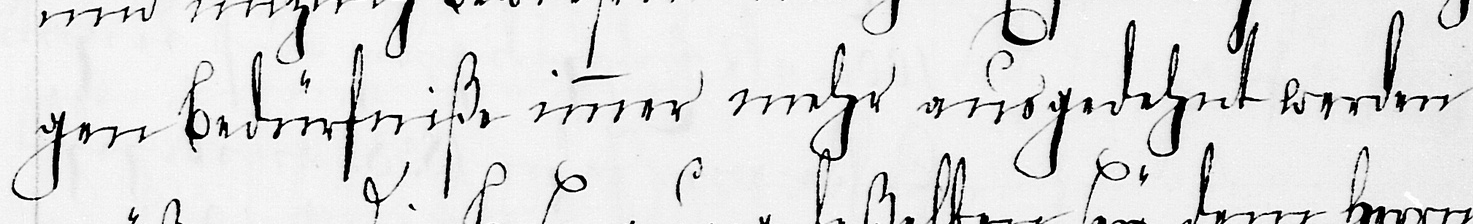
gen Bedürfniße immer mehr ausgedehnt werden
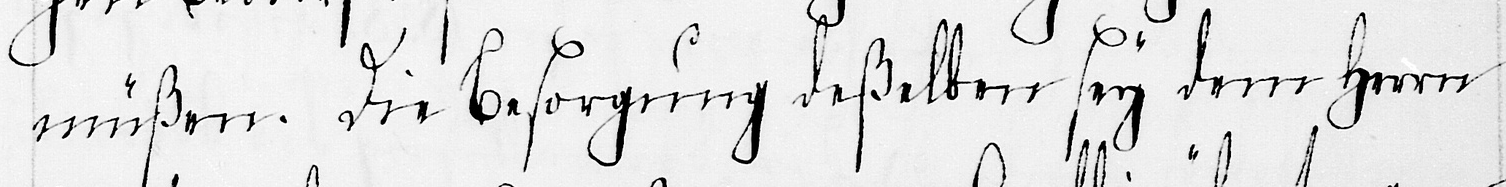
müßen. Die Besorgung deßelben sey dem Herrn
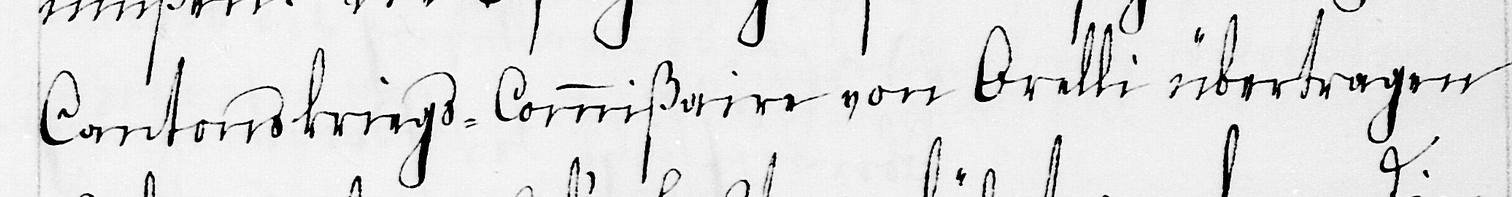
Cantonskriegs-Commißaire von Orelli übertragen
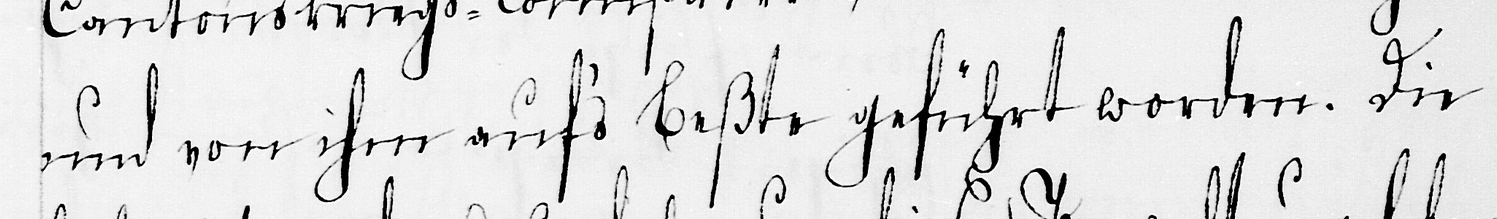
und von ihm auf’s Beßte geführt worden. Die
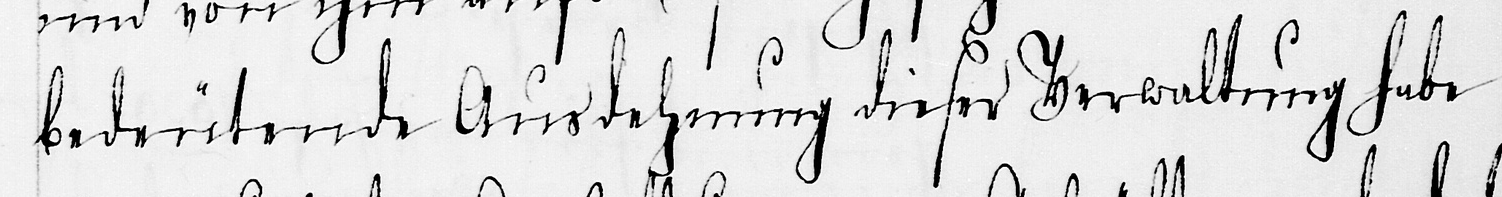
bedeutende Ausdehnung dieser Verwaltung habe
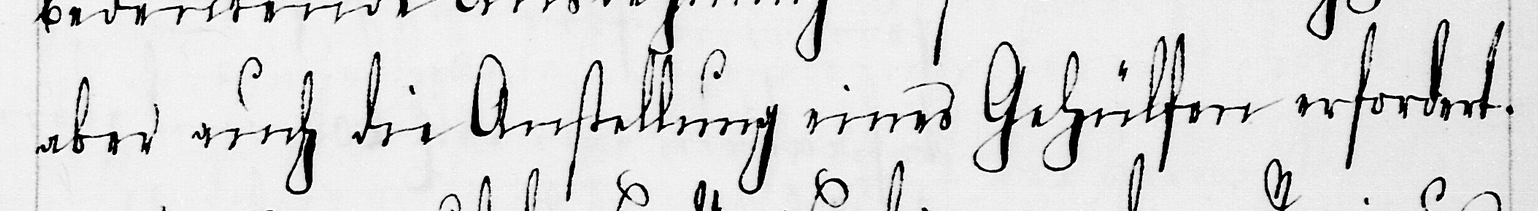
aber auch die Aufstellung eines Gehülfen erfordert.
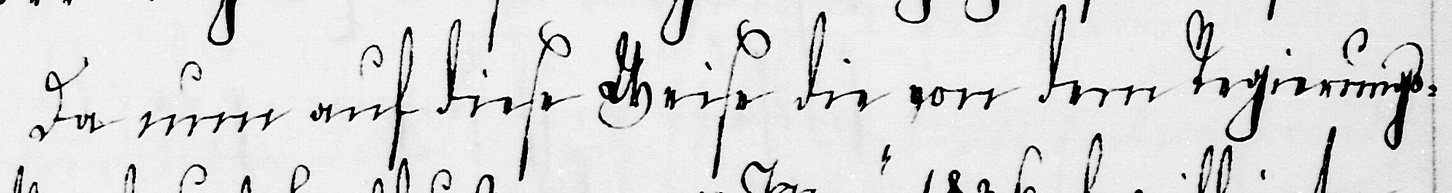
Da nun auf diese Weise die von dem Regierungs¬
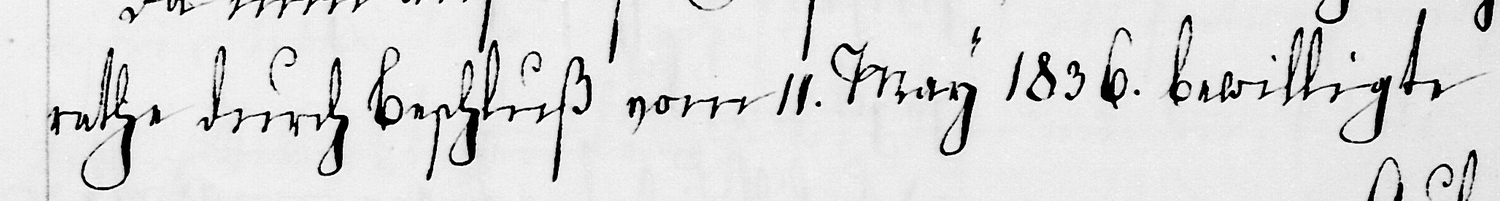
rathe durch Beschluß vom 11. May 1836. bewilligte
